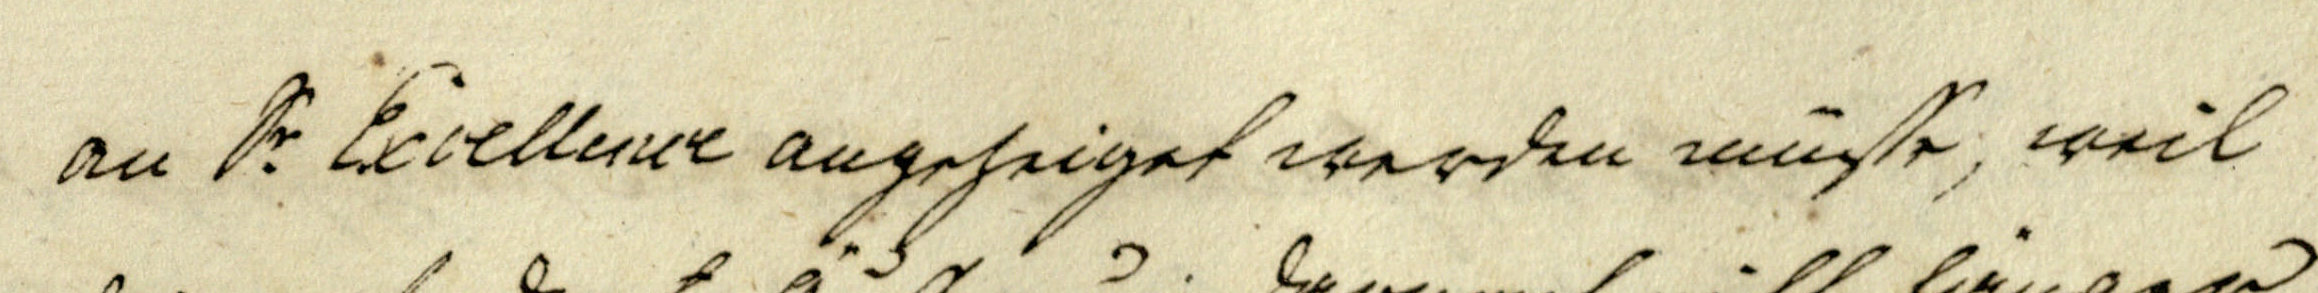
an Sr Excellence angezeiget werden müsse, weil
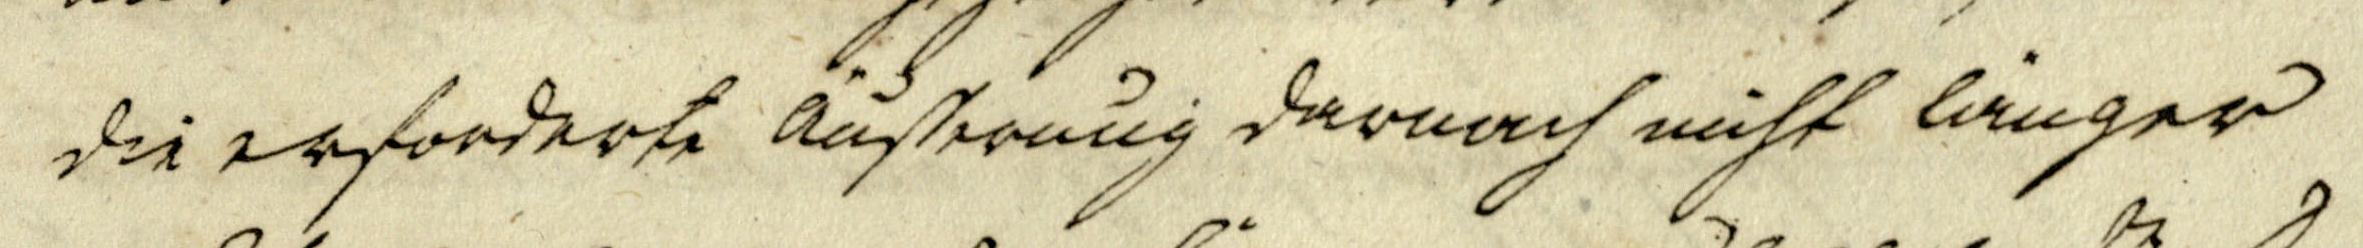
die erforderte Äusserung darnach nicht länger
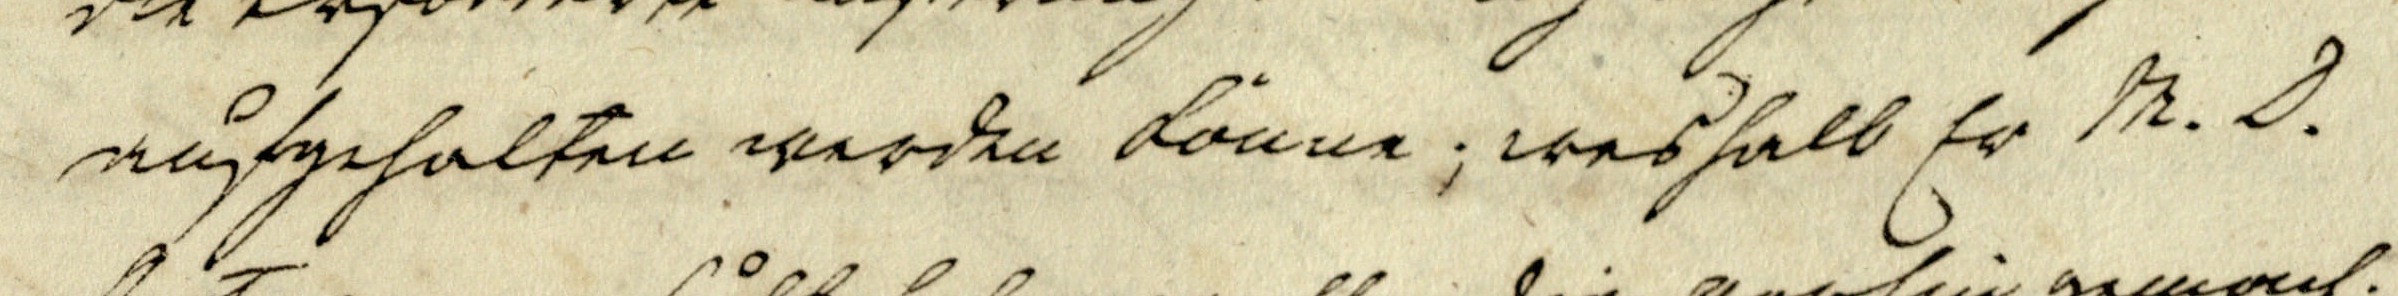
aufgehalten werden könne; weshalb Er M. D.
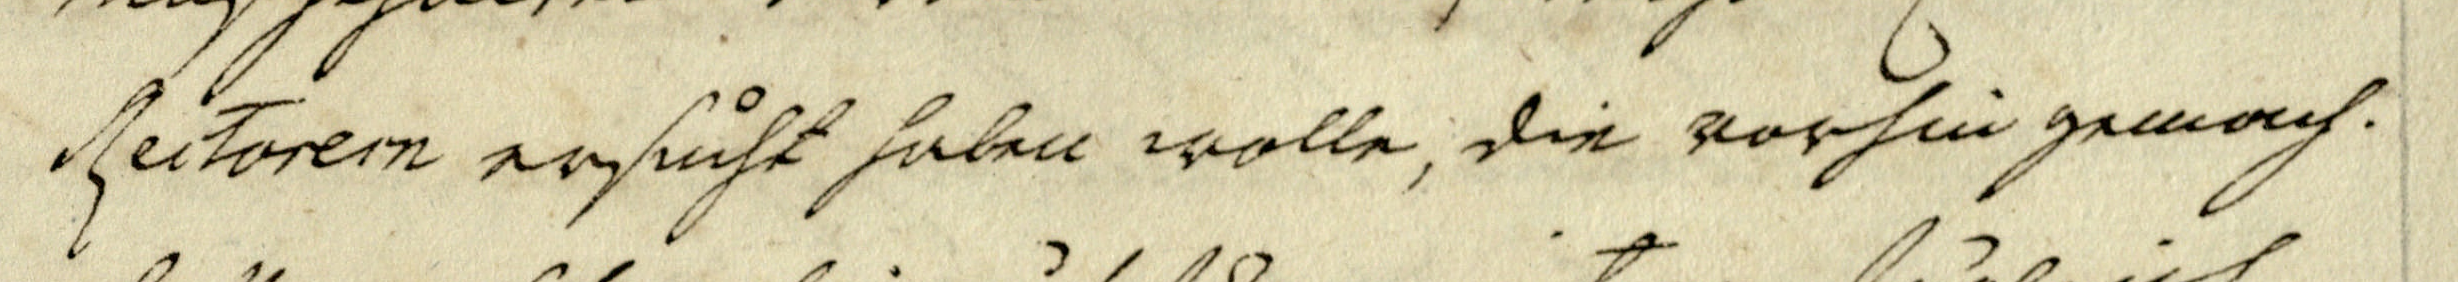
Rectorem ersucht haben wolle, die vorhin gemach¬
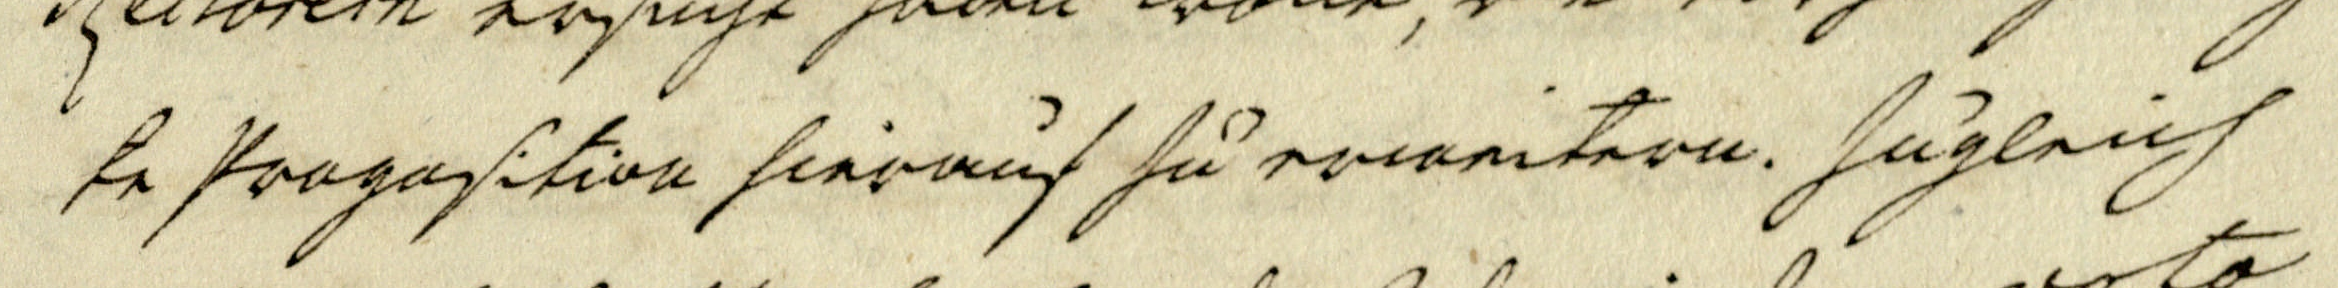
te Proposition hierauf zu erweitern. Zugleich
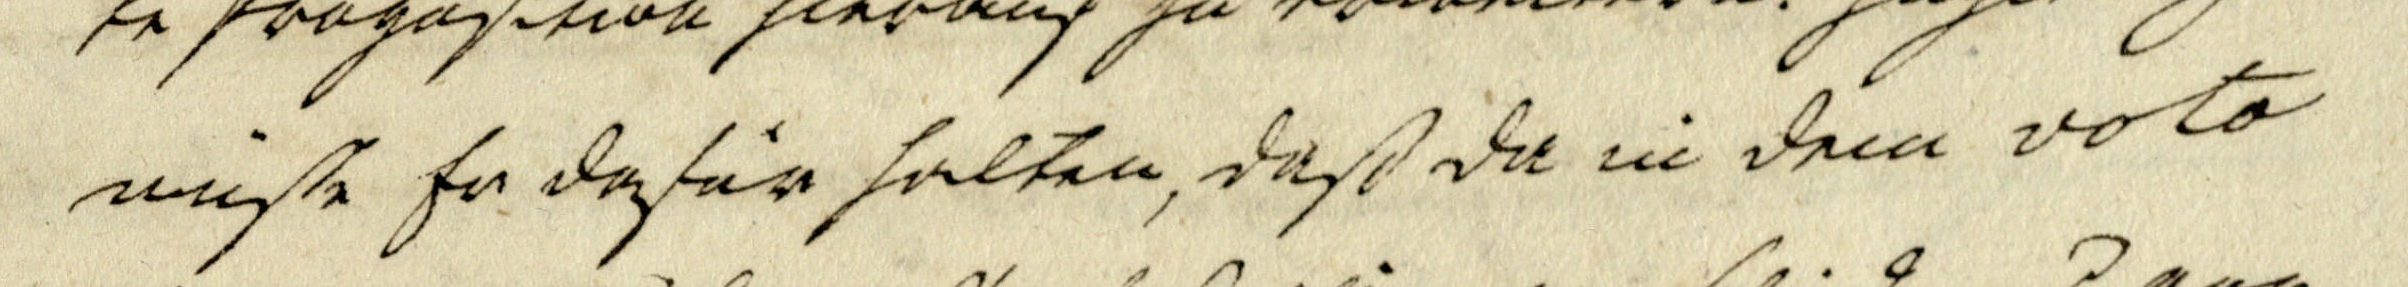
müsse Er dafür halten, daß da in dem voto
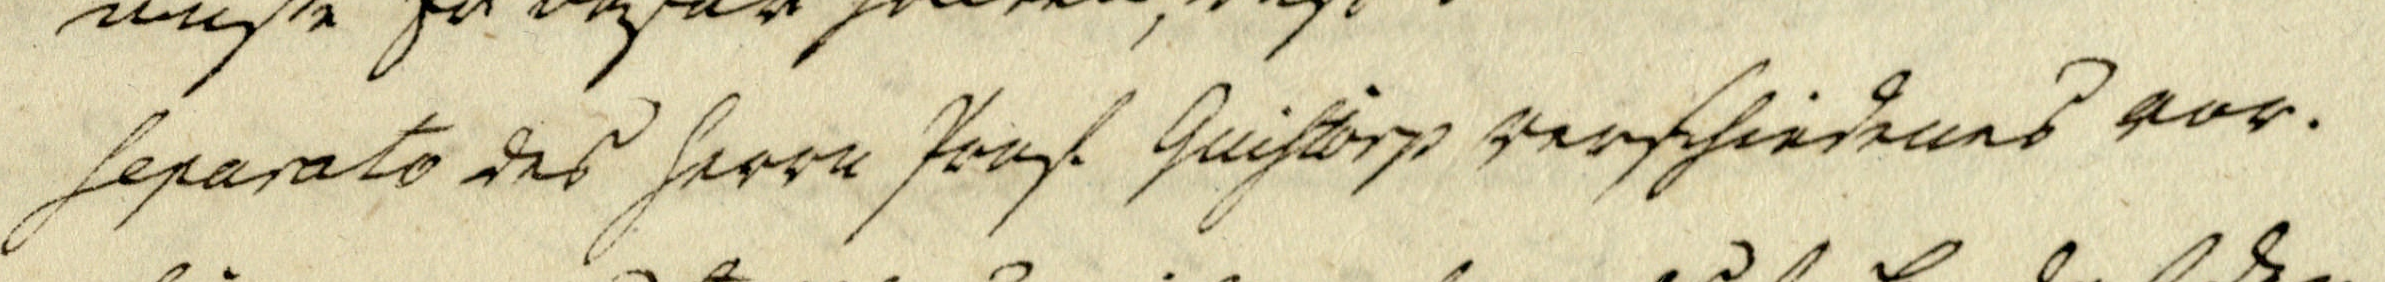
separato des Herrn Prof. Quistorp verschiedenes vor¬
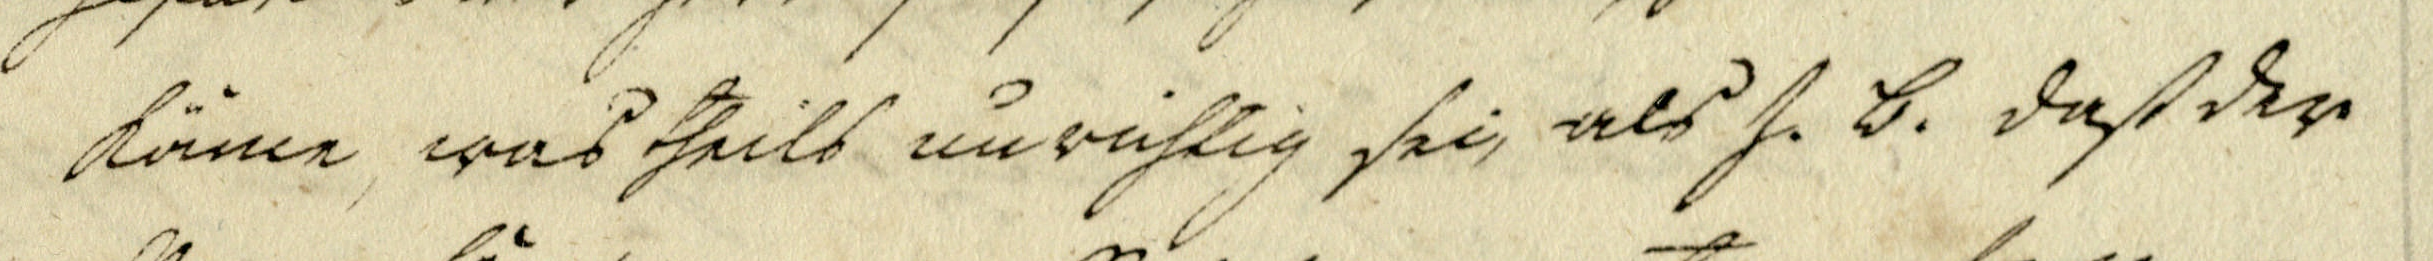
käme was theils unrichtig sei, als z. B. daß der
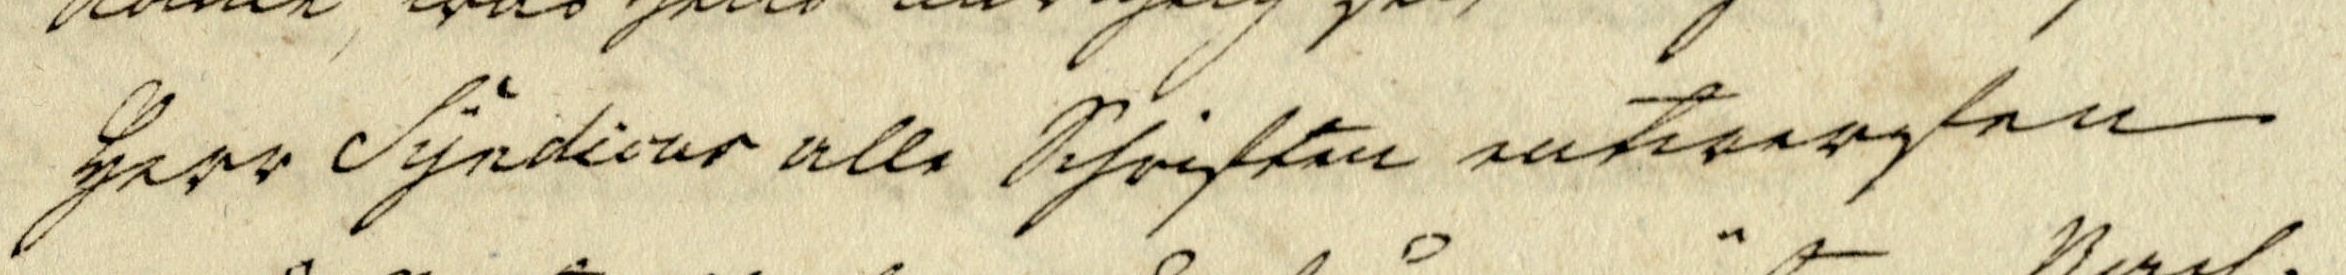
Herr Sÿndicus alle Schriften entwerfen
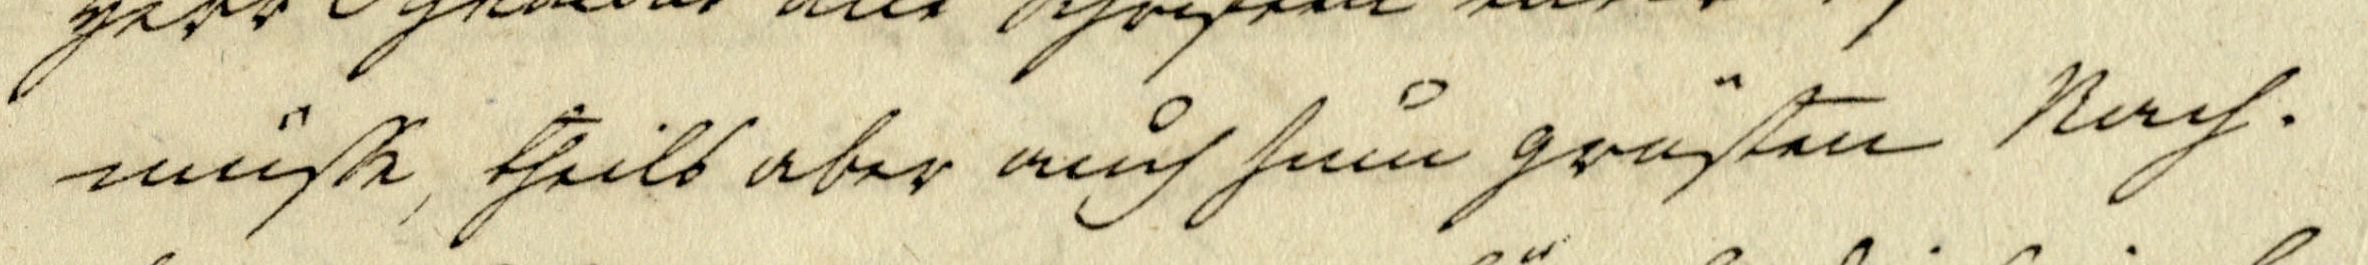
müsse, theils aber auch zum grösten Nach¬
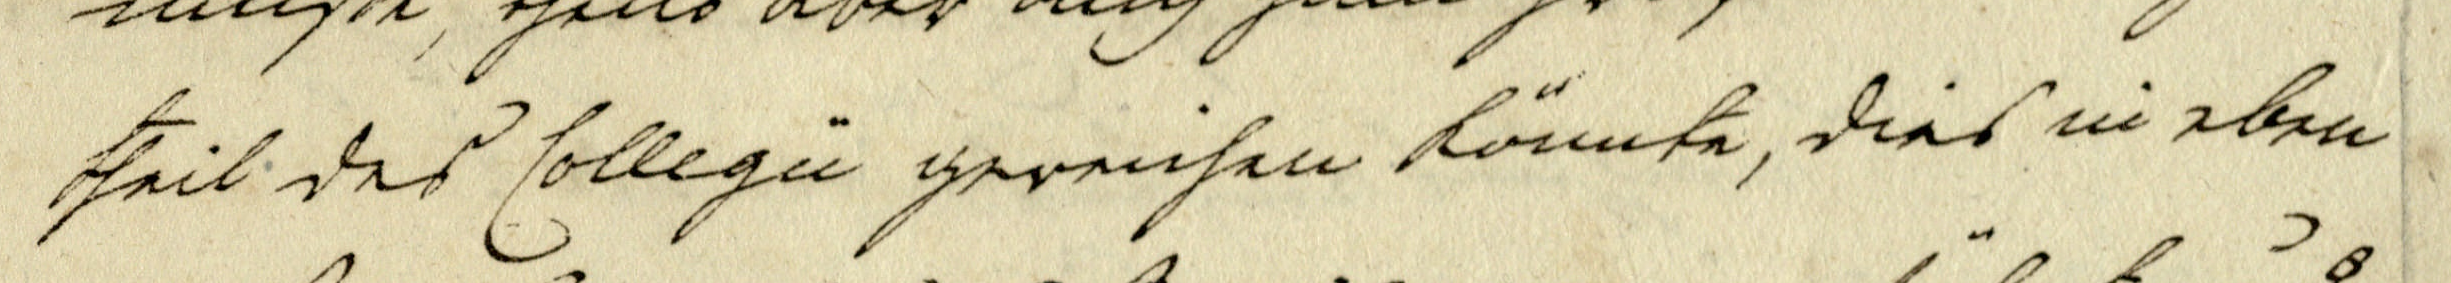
theil des Collegii gereichen könnte, dies in eben
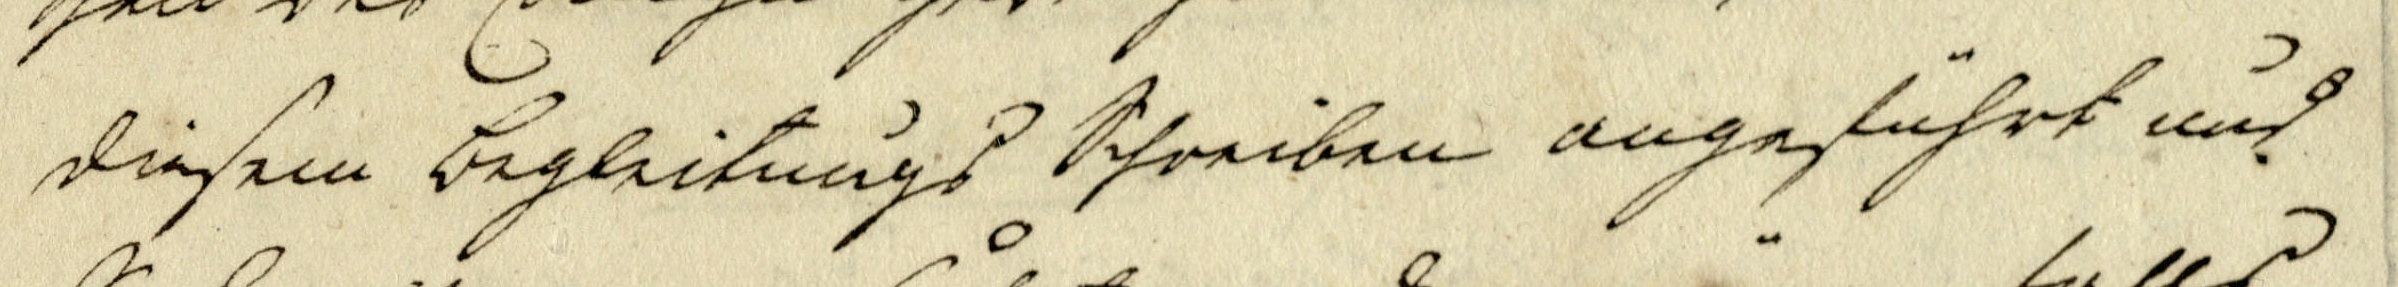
diesem Begleitungs Schreiben angeführt und
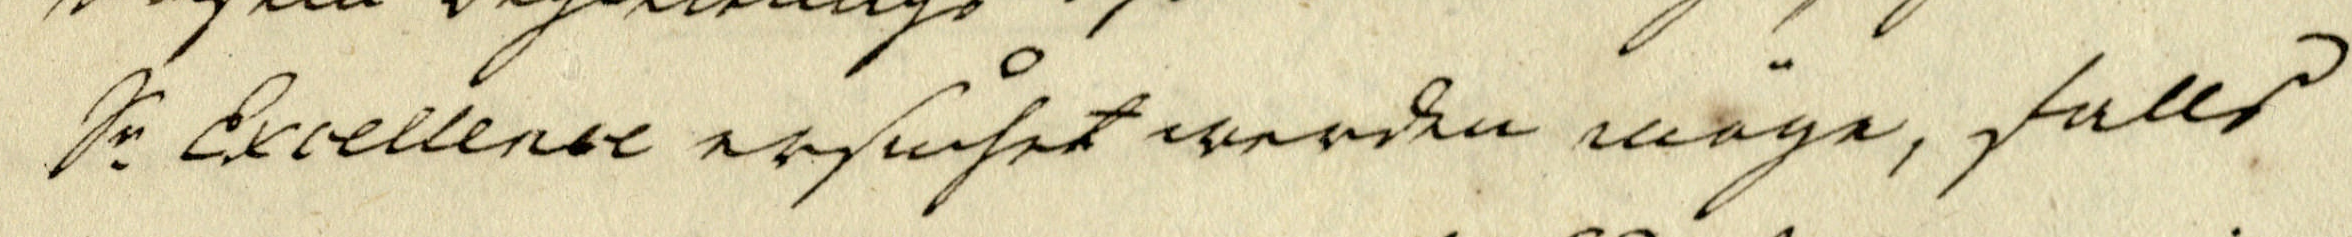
Sr Excellence ersuchet werden möge, falls
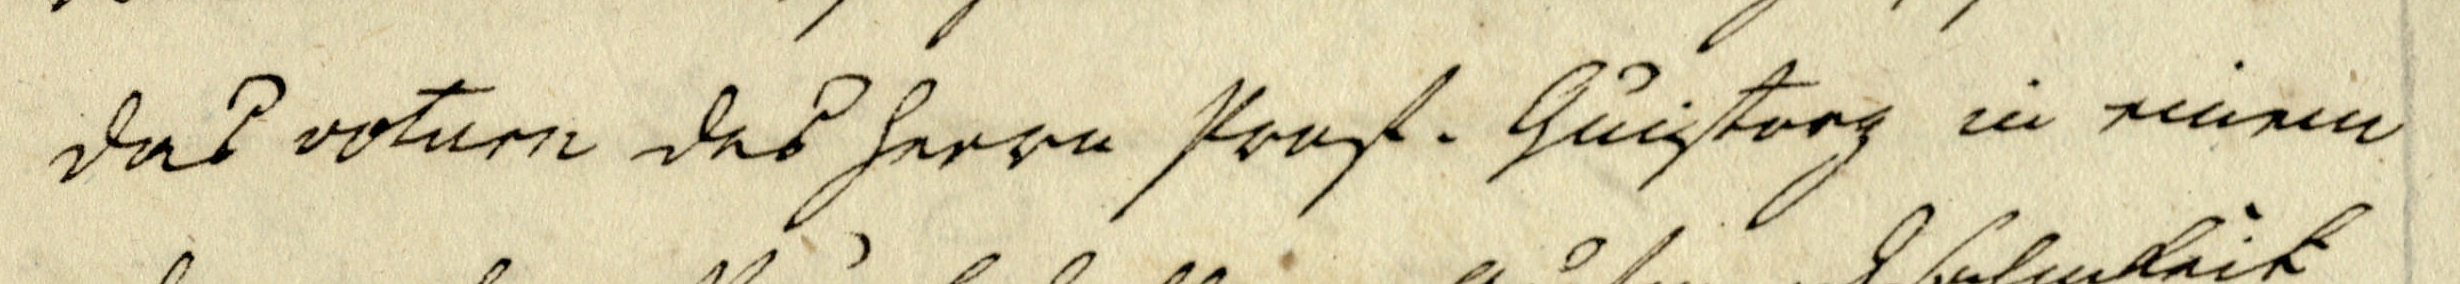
das votum des Herrn Prof. Quistorp in einem
